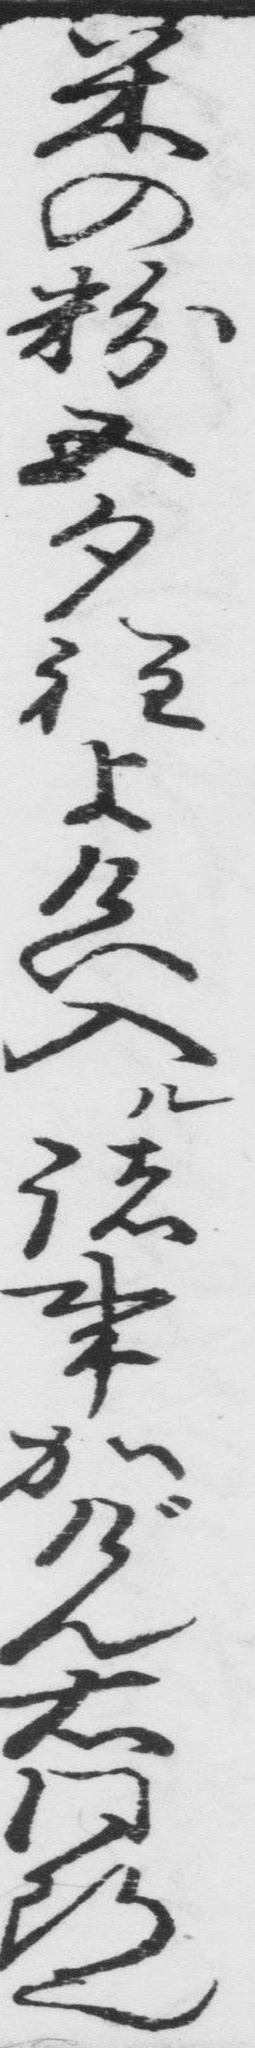米の粉五勺程よけい入る諸事かげん右同断也
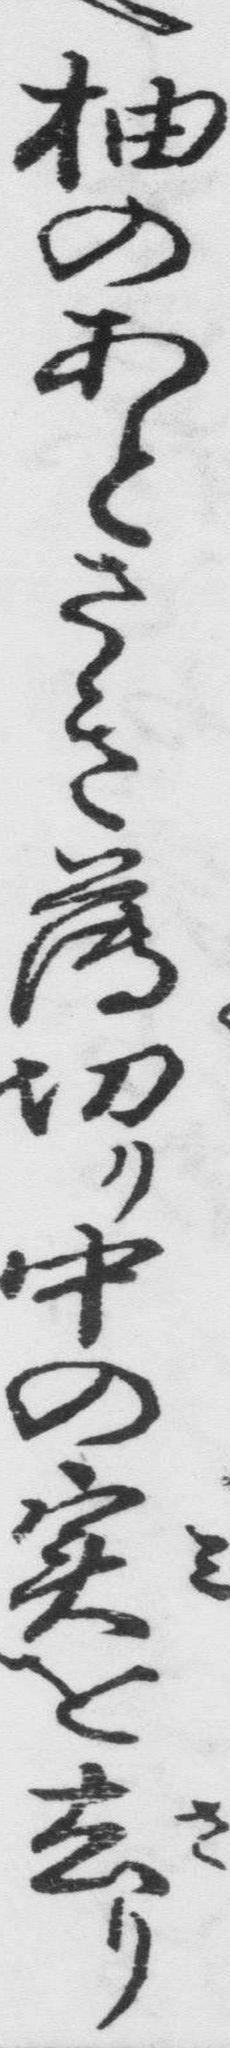柚のあとさき薄く切り中の実を去り
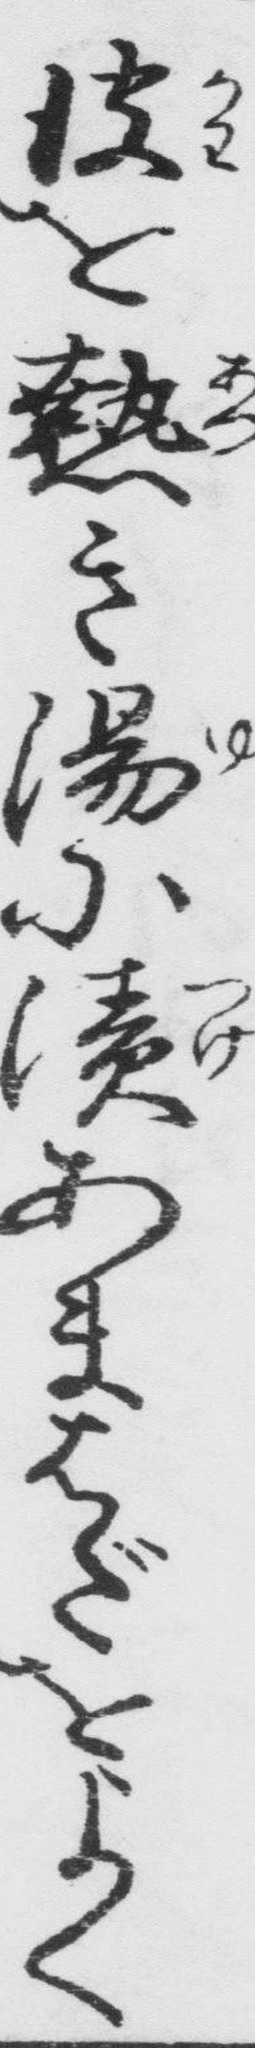皮を熱き湯に漬あまはだをよく
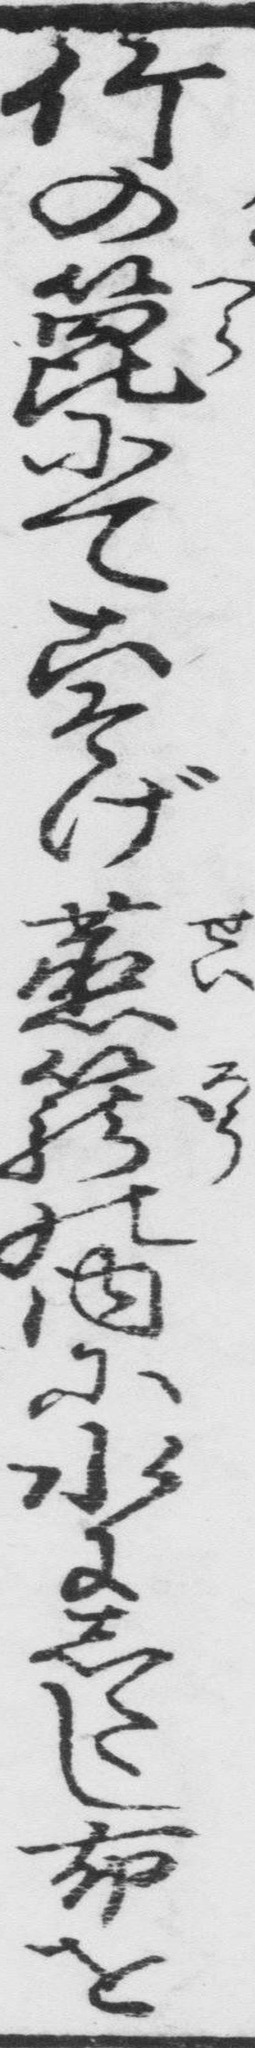竹の箆にてこそげ蒸籠の内に水にしたし布を
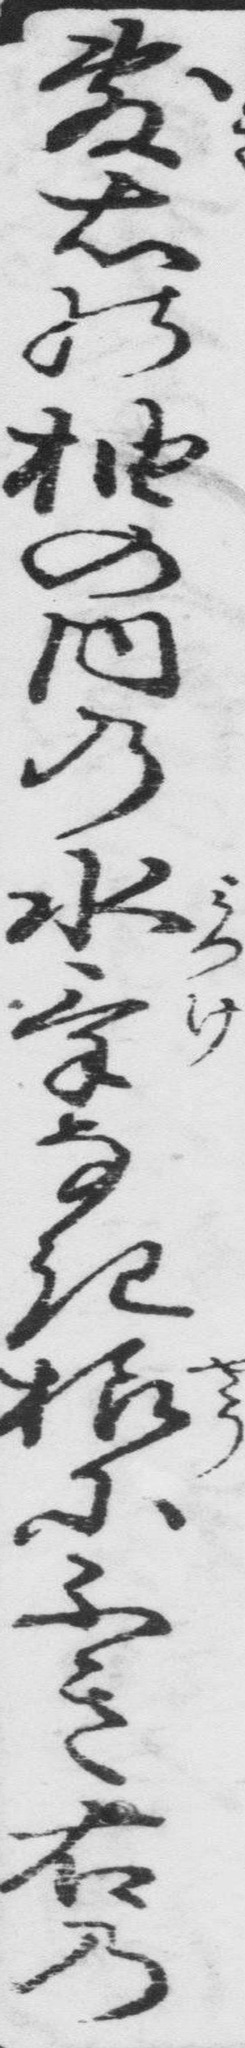敷右の柚の内の水気なき様にふき右の

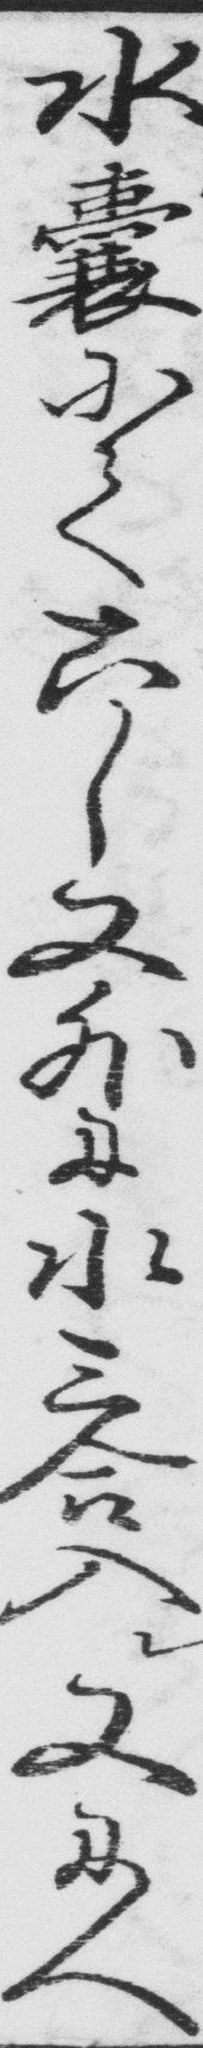水嚢にてこし又外に水三合入又にへ
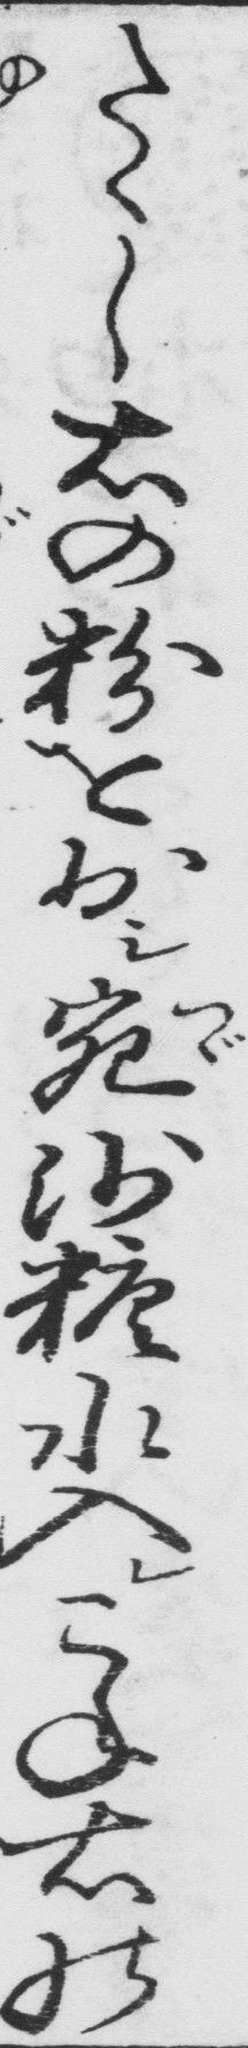たゝし右の粉を少宛沙糖水入右の
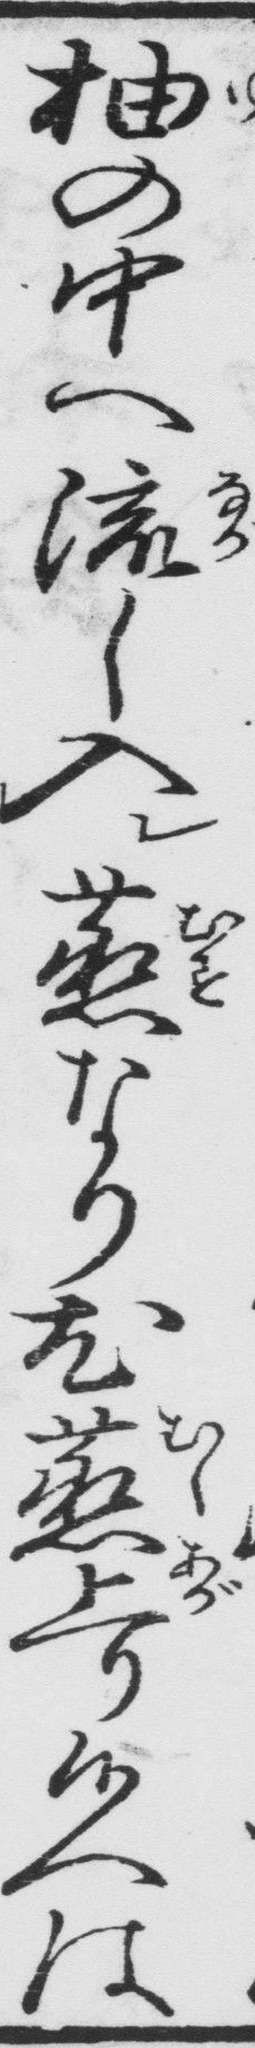柚の中へ流し入蒸なり尤蒸上り候へは
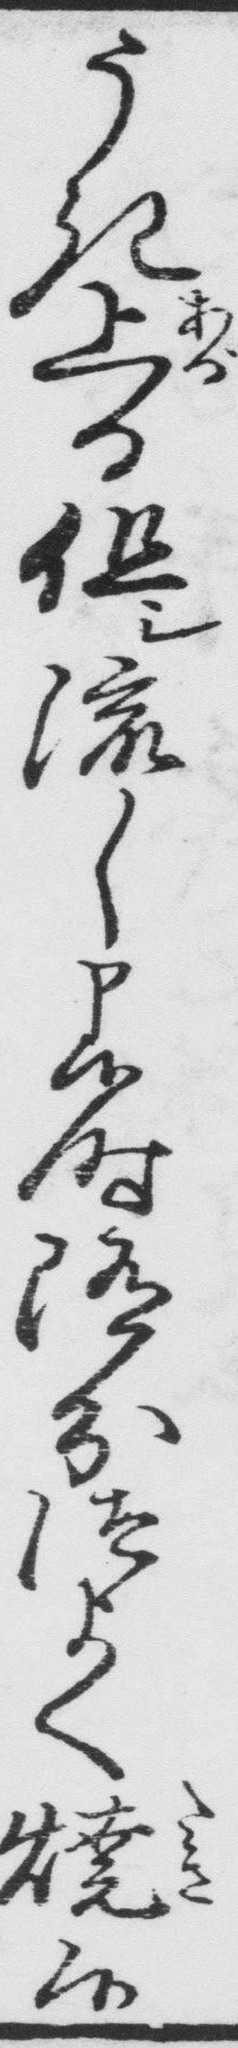うき上る但流し申候時随分つよく焼候
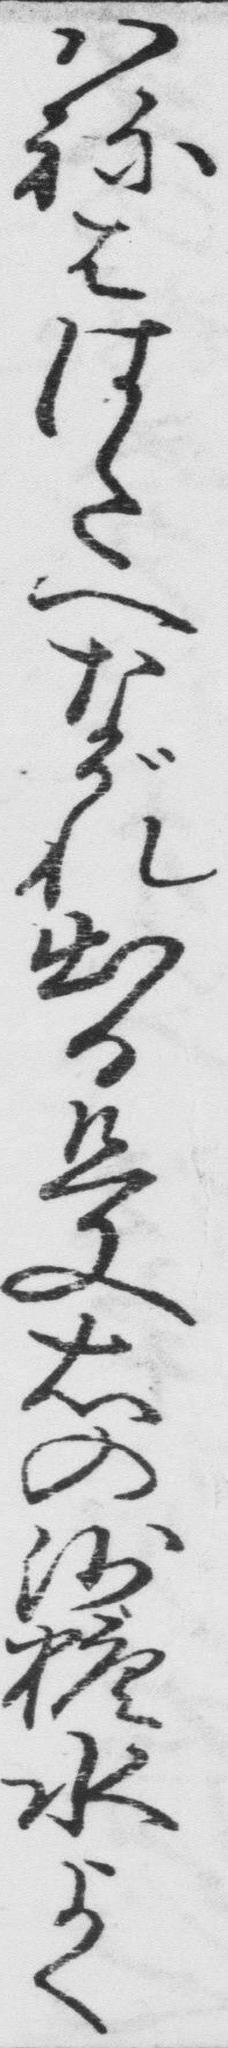はねははたへながれ出る是右の沙糖水よく
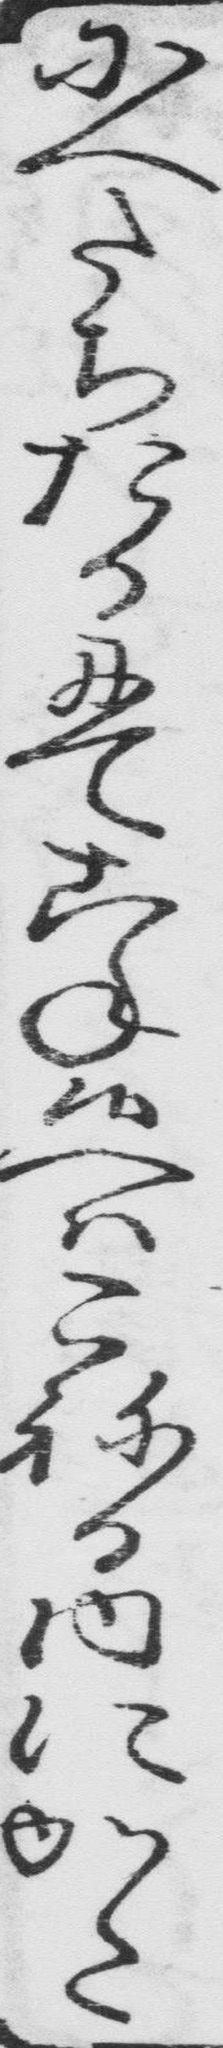にへたちたるにてこね候へはこねる内にかた
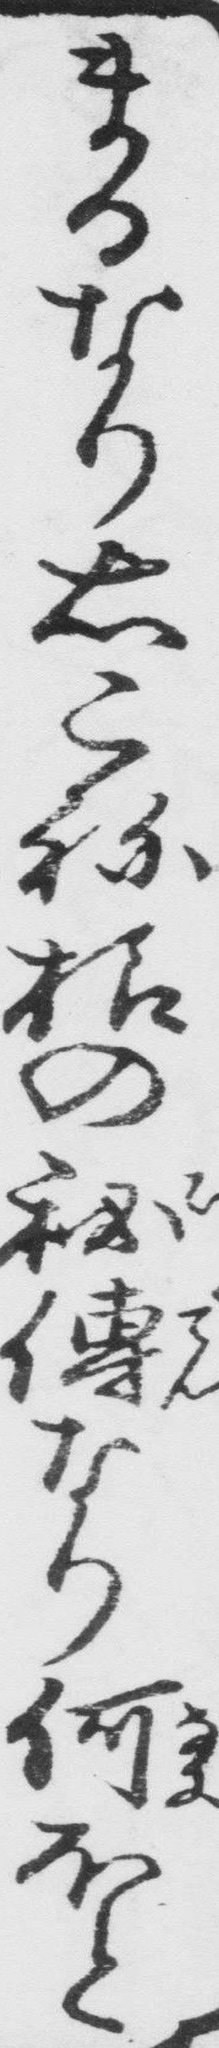まるなり右こね様の秘伝なり何ほと
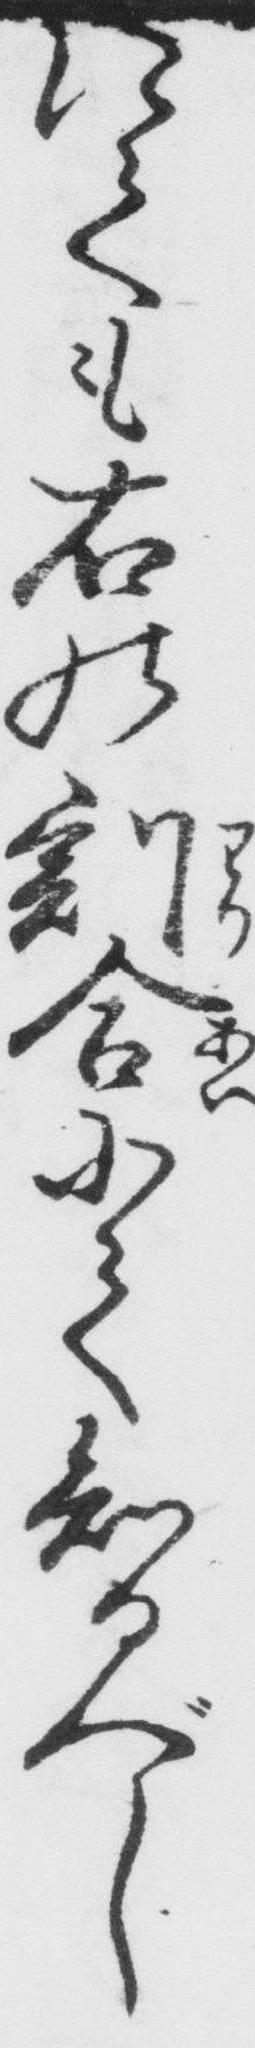にても右の割合にて知るべし
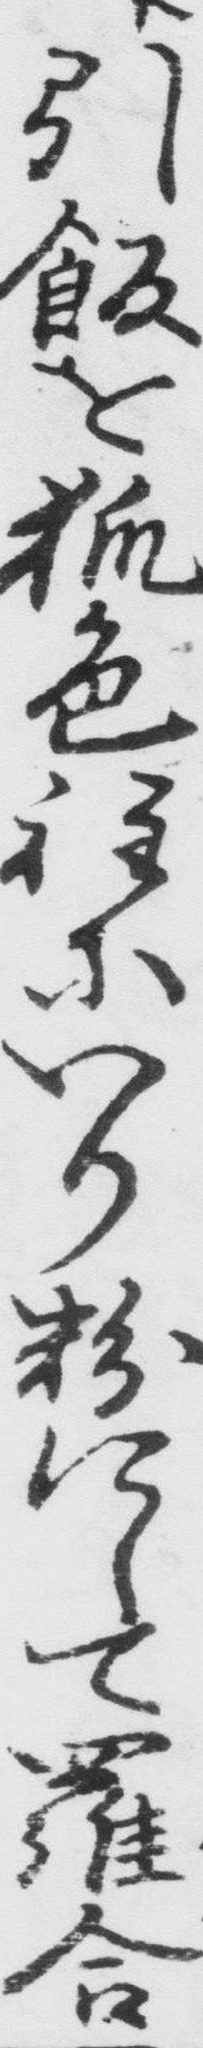引飯を狐色程にいり粉にして羅合
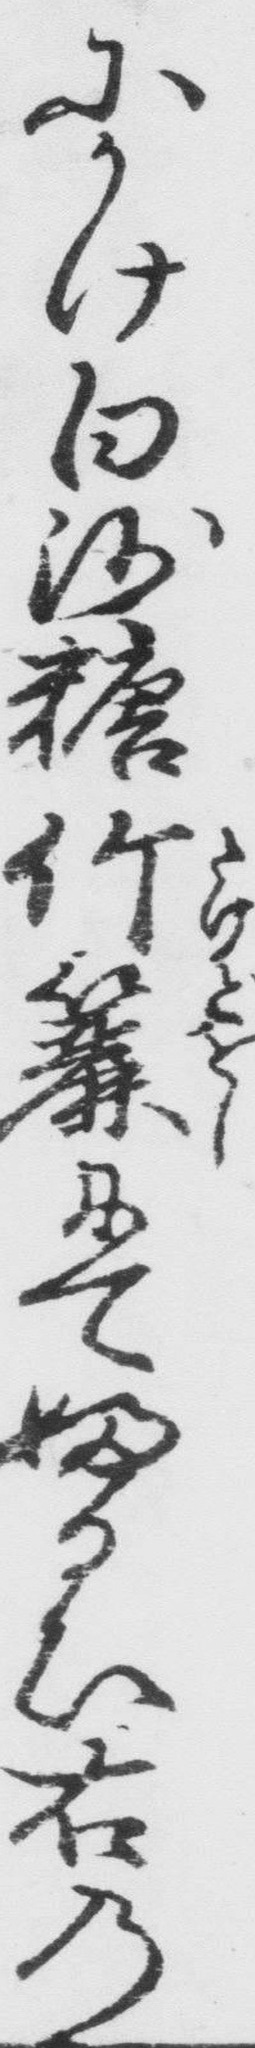にかけ白沙糖竹簾にてふるひ右の
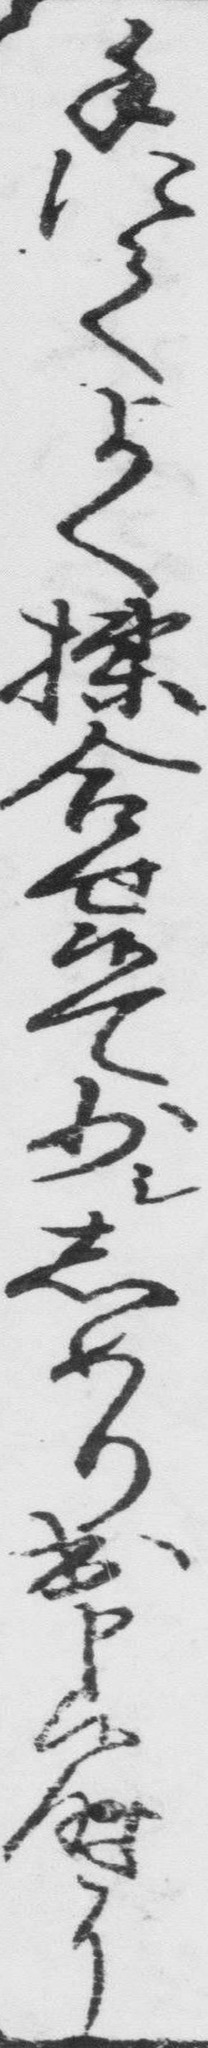手にてよく揉合せ候て少ししめり出申候時に
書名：御前菓子図式
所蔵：大阪府立大学学術情報センター 国文学研究資料館
